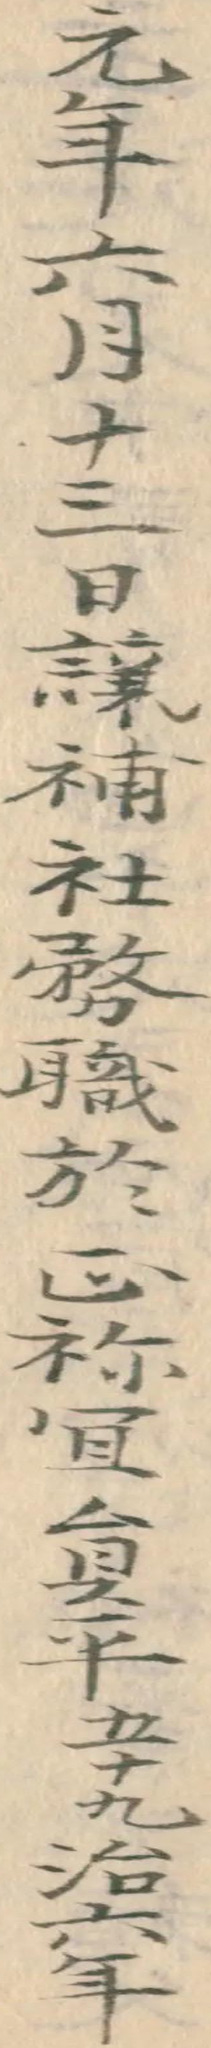元年六月十三日譲補社務職於正祢宜員平五十九治六年
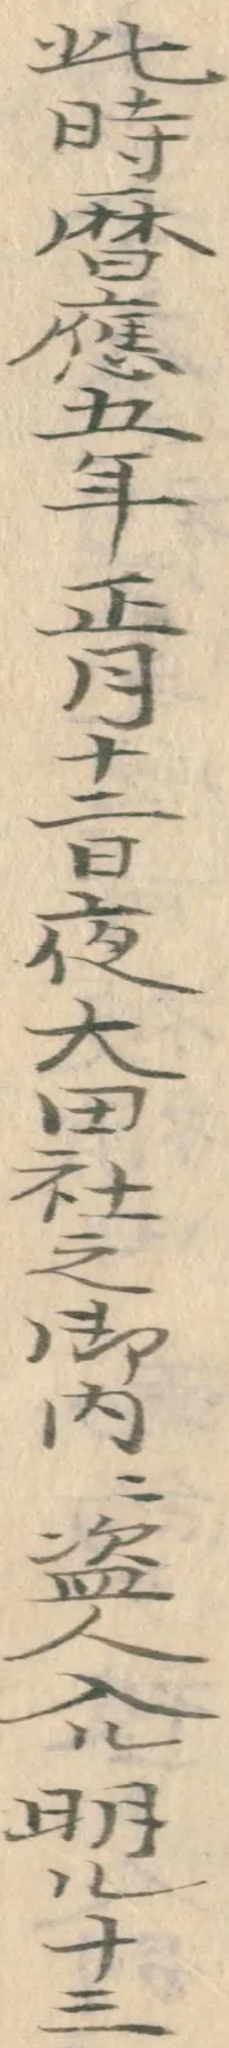此時暦応五年正月十二日夜大田社之御内ニ盗人入ル明ル十三
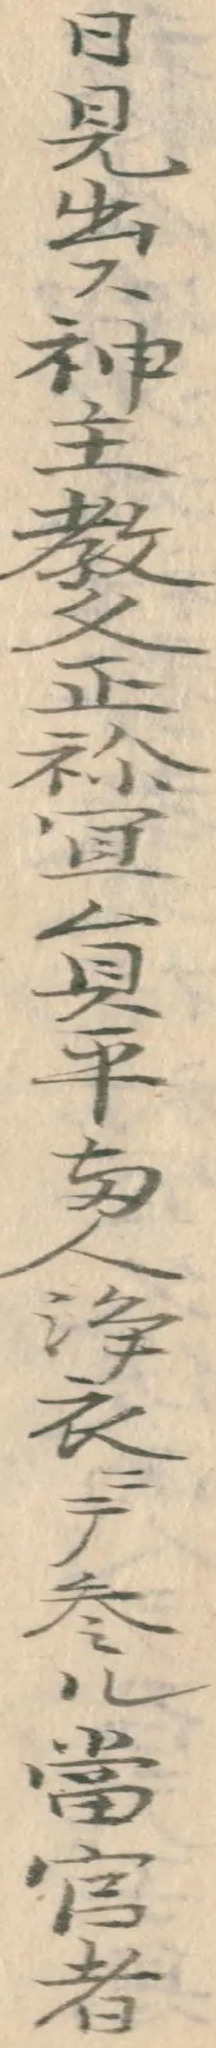日見出ス神主教久正祢宜員平両人浄衣ニテ参ル当官者
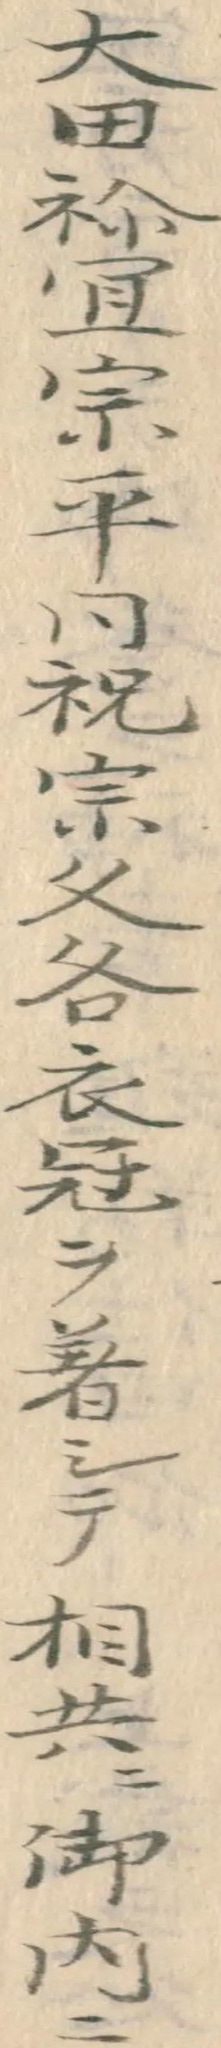大田祢宜宗平同祝宗久各衣冠ヲ着シテ相共ニ御内ニ
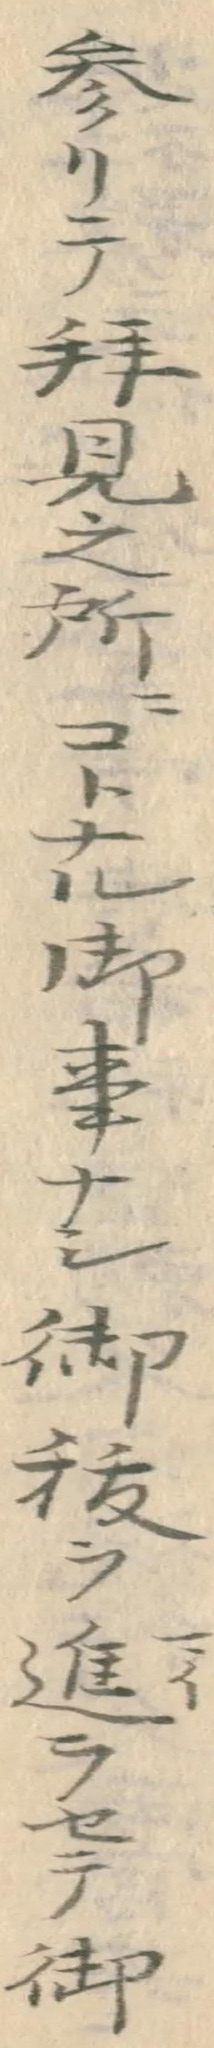参リテ拝見之所ニコトナル御事ナシ御祓ヲ進ラセテ御
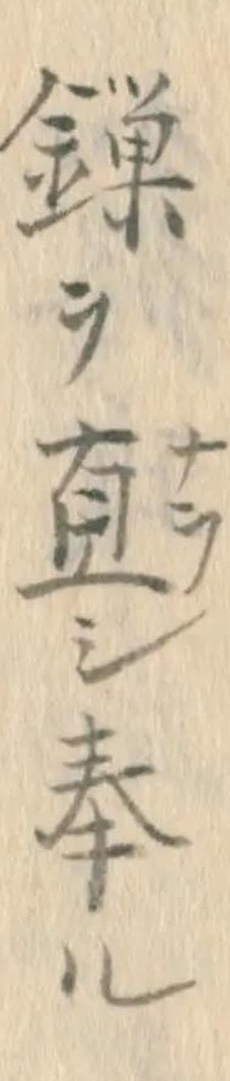鏁ヲ直シ奉ル
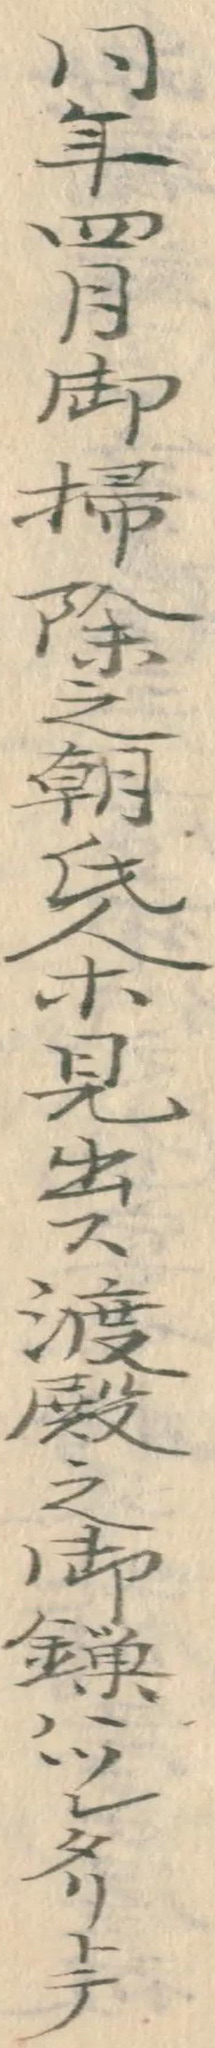同年四月御掃除之朝氏人等見出ス渡殿之御鏁ハツレタリトテ
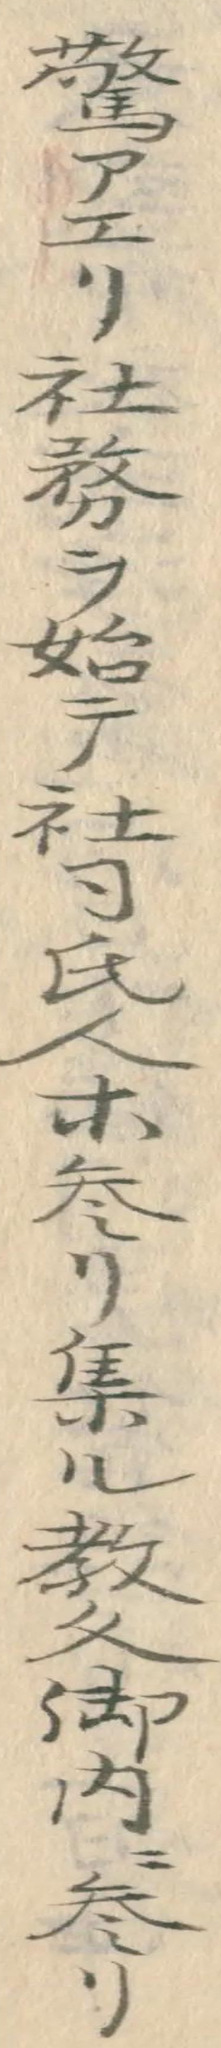驚アエリ社務ヲ始テ社司氏人等参リ集ル教久御内ニ参リ
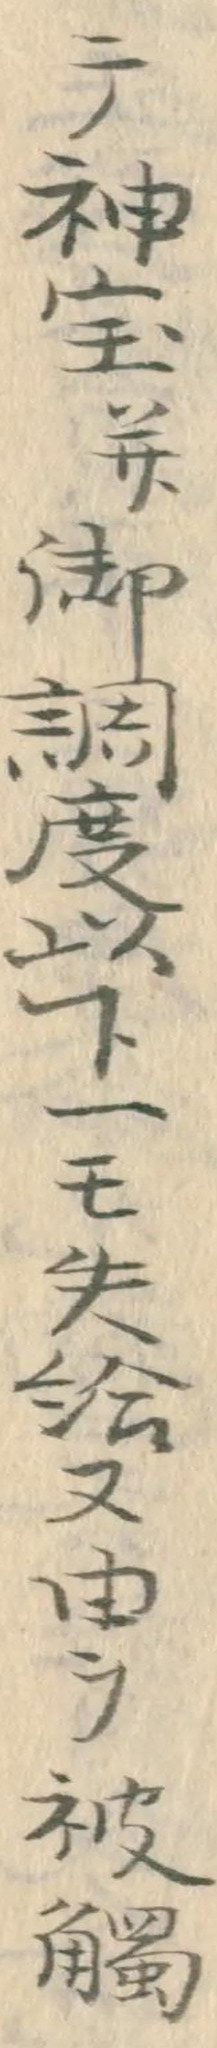テ神宝并御調度以下一モ失給ヌ由ヲ被触
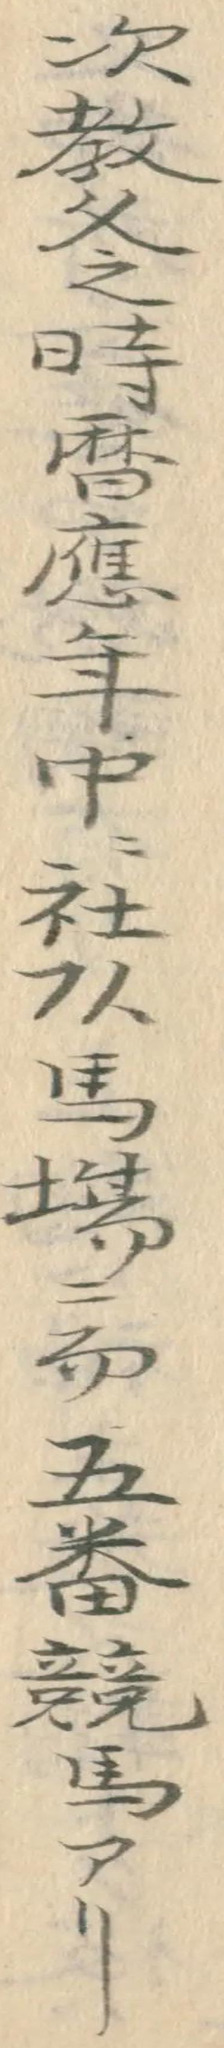次教久之時暦応年中ニ社頭馬場ニ而五番競馬アリ

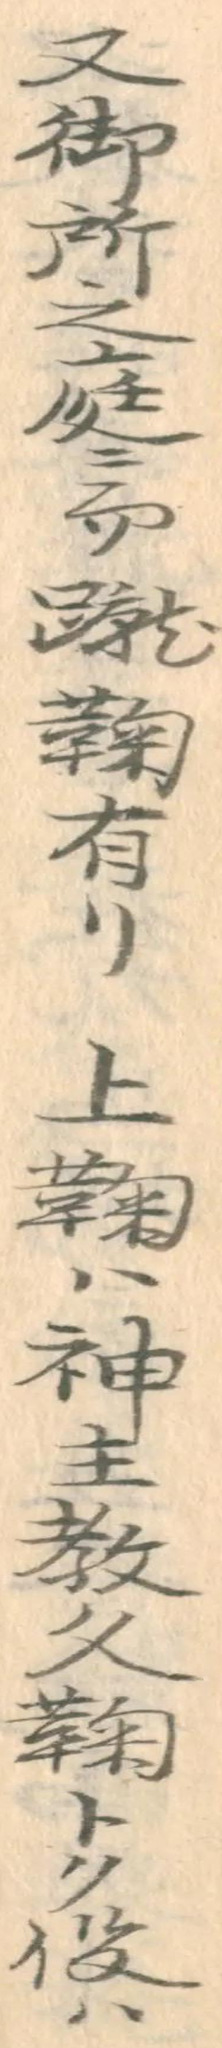又御所之庭ニ而蹴鞠有リ上鞠ハ神主教久鞠トク役ハ
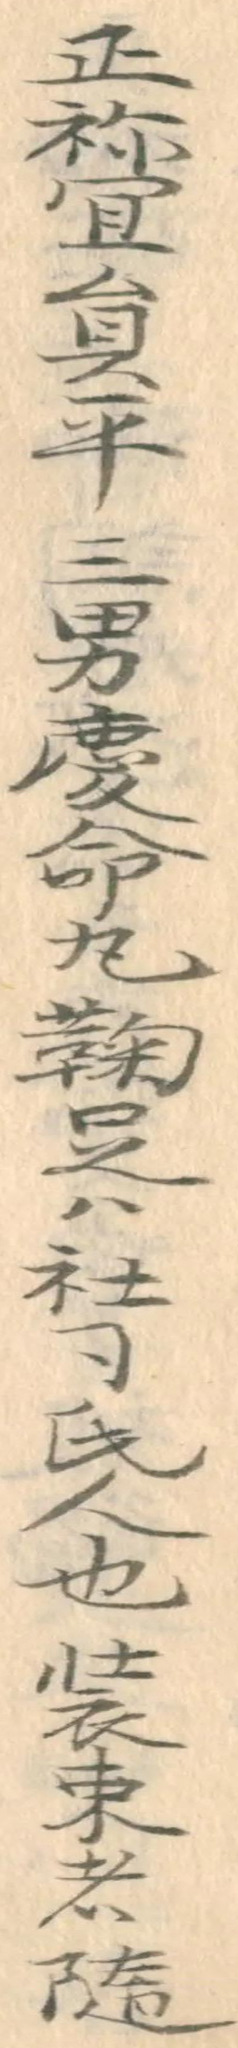正祢宜員平三男慶命丸鞠足ハ社司氏人也装束者随
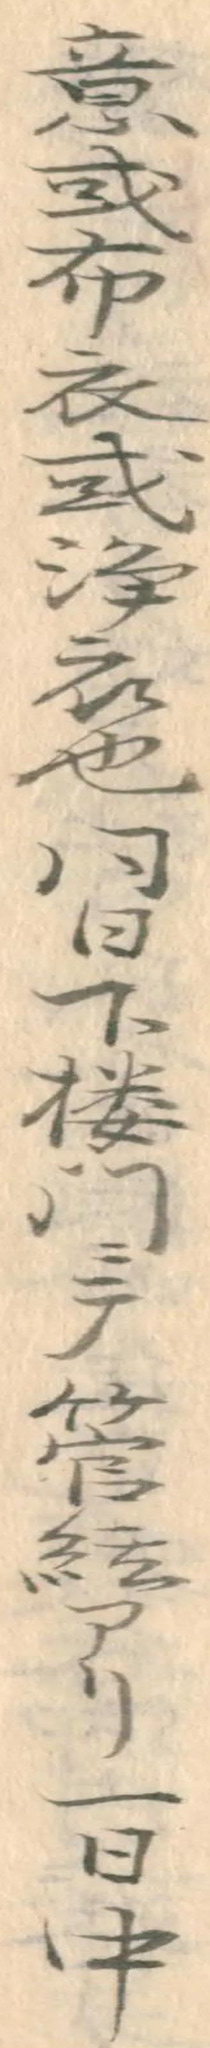意或布衣浄衣也同日下楼門ニテ管絃アリ一日中
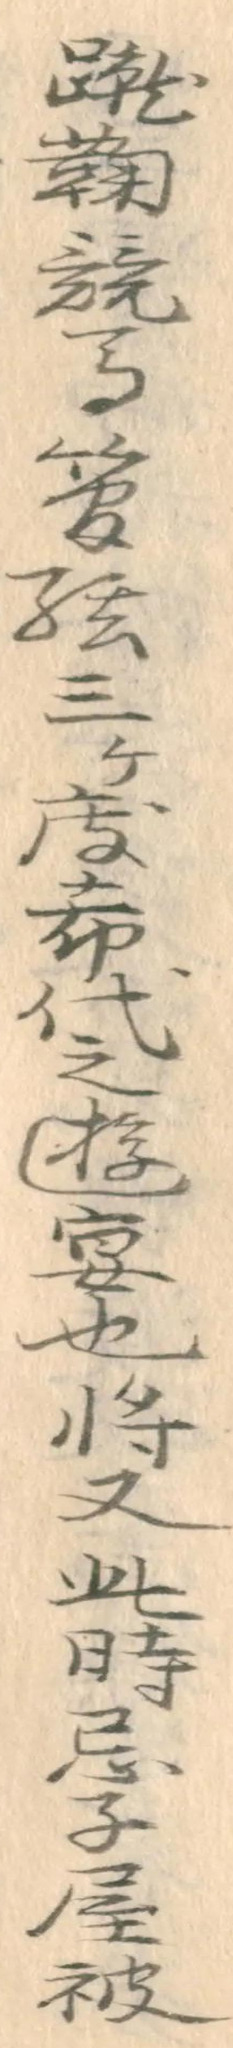蹴鞠競馬管絃三ケ度希代之遊宴也将又此時忌子屋被
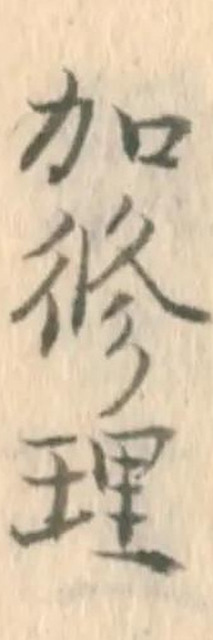加修理
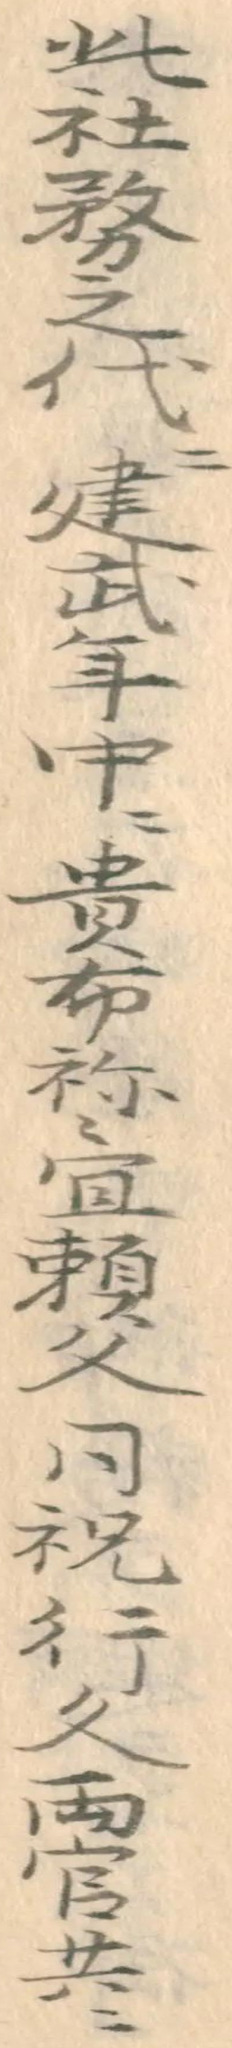此社務之代ニ建武年中ニ貴布祢々宜頼久同祝行久両官共ニ
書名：賀茂社記録. 第24冊
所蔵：国立国会図書館 National Diet Library, JAPAN
